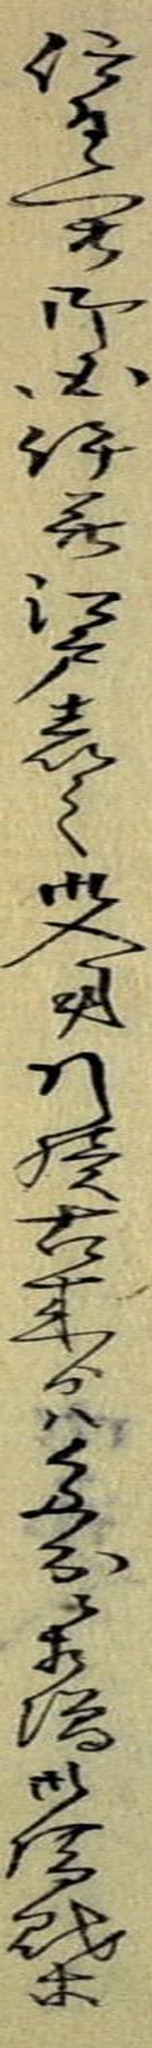仰付候へ共御国許并江戸表之御入用引続古来ゟハ多分ニ相増御借財等
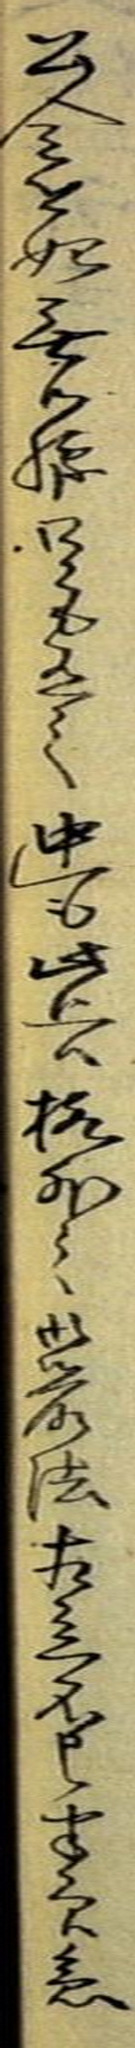公金を始無御拠口々も有之迚も此上ハ格外之御厳法相立不申候半而ハ急
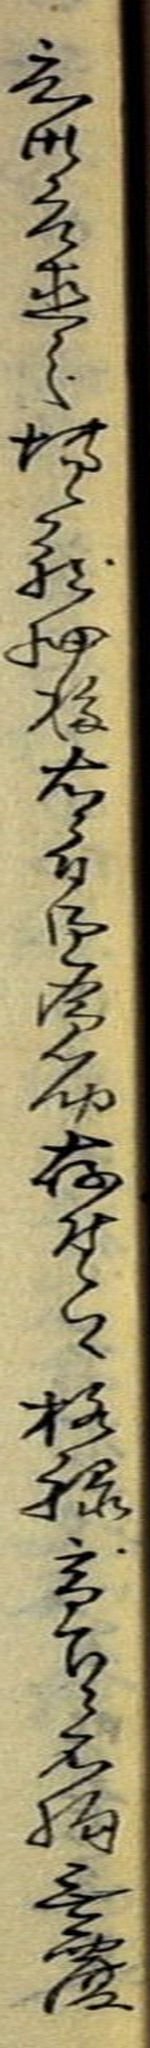度御取直之場へ難押移右ニ付御為筋存付候ハヽ格禄高下ニ不拘無覆
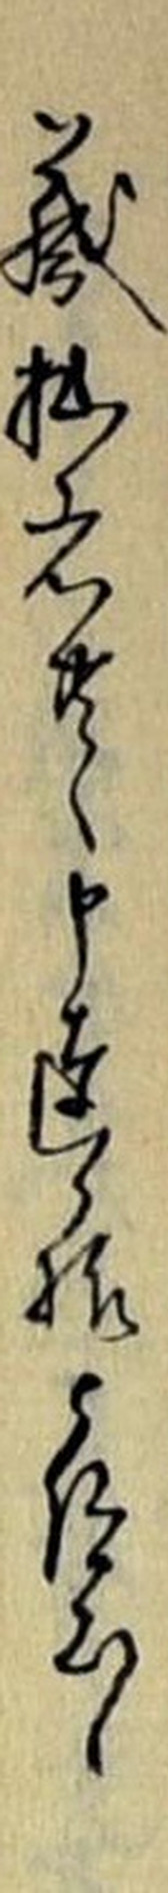蔵拙者共へ申達候様被仰出候
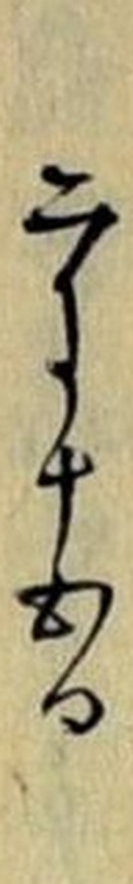二月十五日
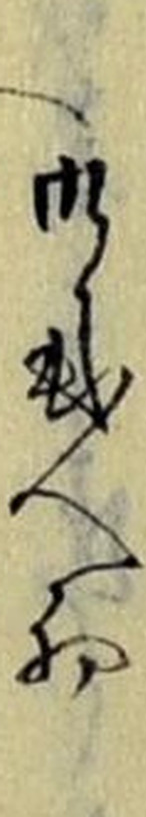御用人初
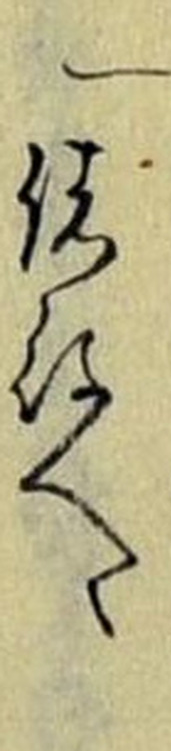諸役人へ
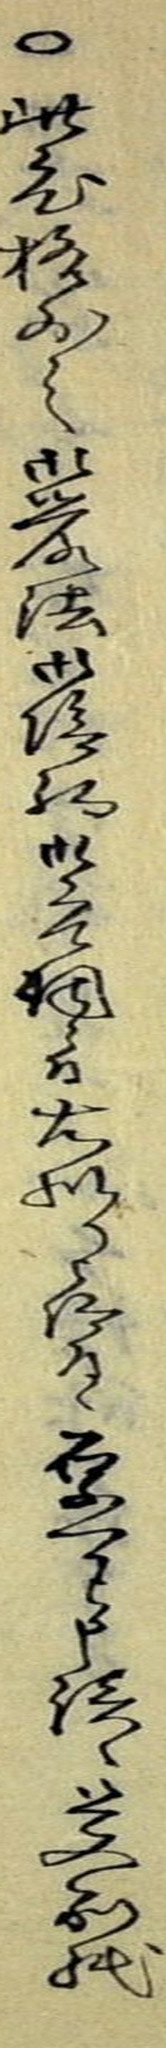〇此度格別之御厳法御倹約御取調ニ付右掛り被仰付候厚可被申談候且又別紙
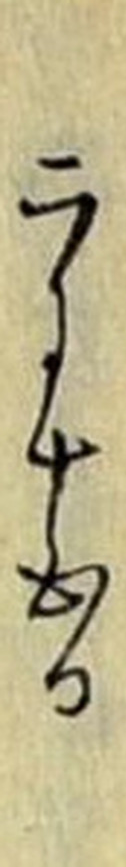二月十五日
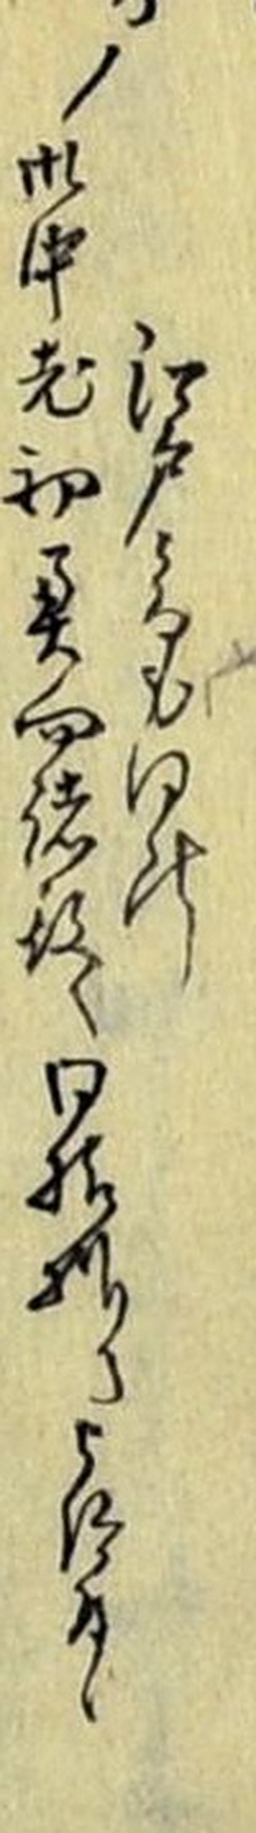御中老初奥向諸役へ同様掛り被仰付候
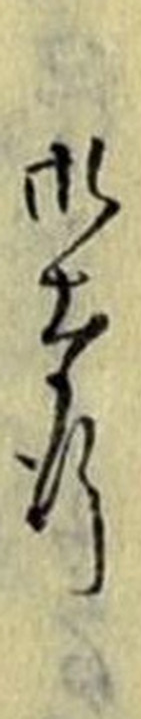御奉行
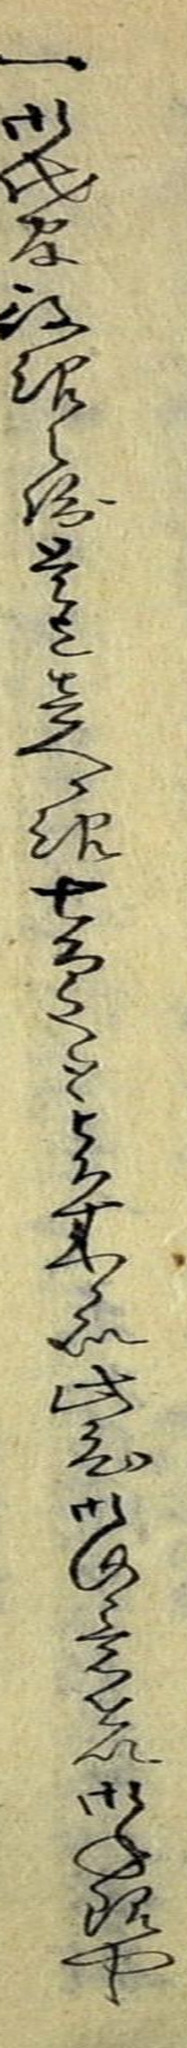一御代官役銀之儀是迄壱人へ銀七百匁ツヽ被下来候処此度御趣意を以御年限中
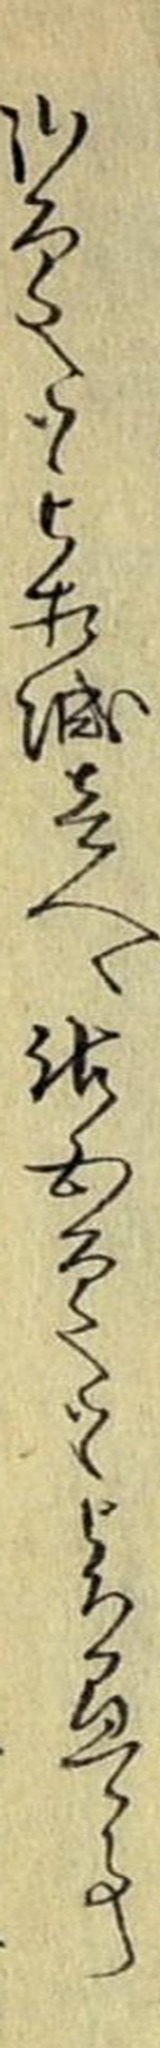弐百匁ツヽ被相減壱人へ銀五百匁ツヽ被下置候事
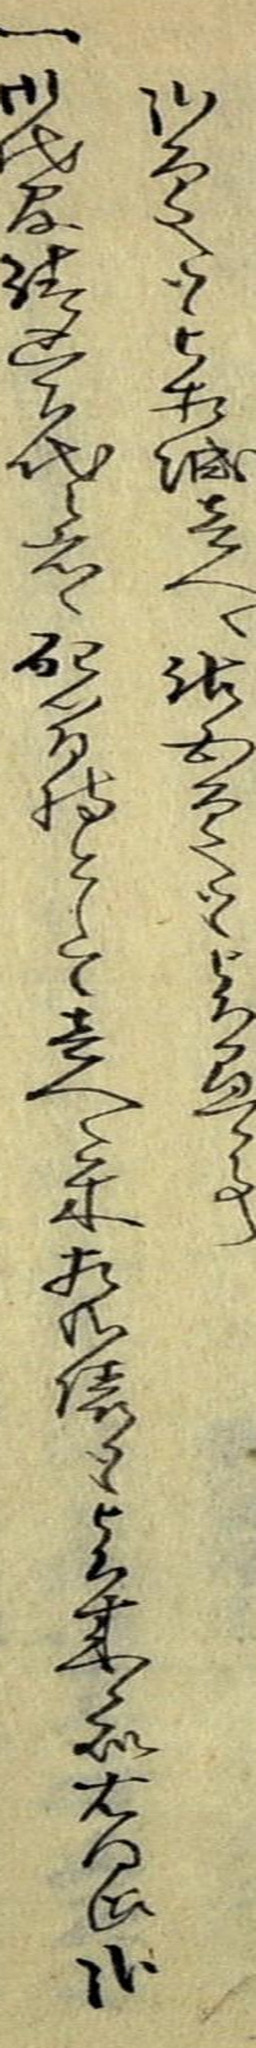一御代官請込下代之者へ配符持として壱人米拾弐俵ツヽ被下来候処右同趣弐
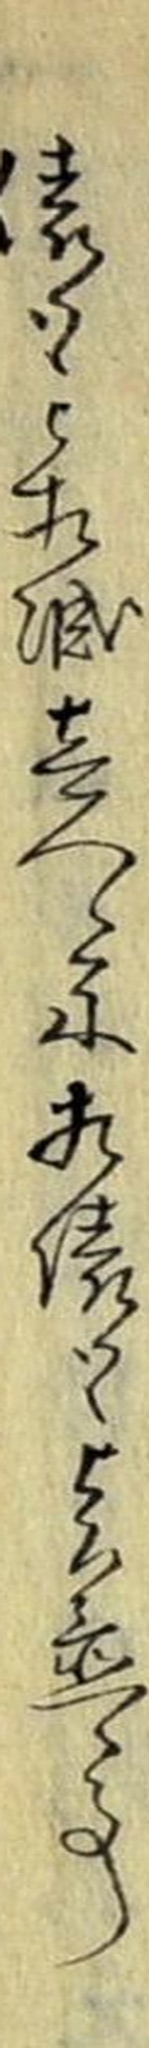俵ツヽ被相減壱人へ米拾俵ツヽ被下置候事
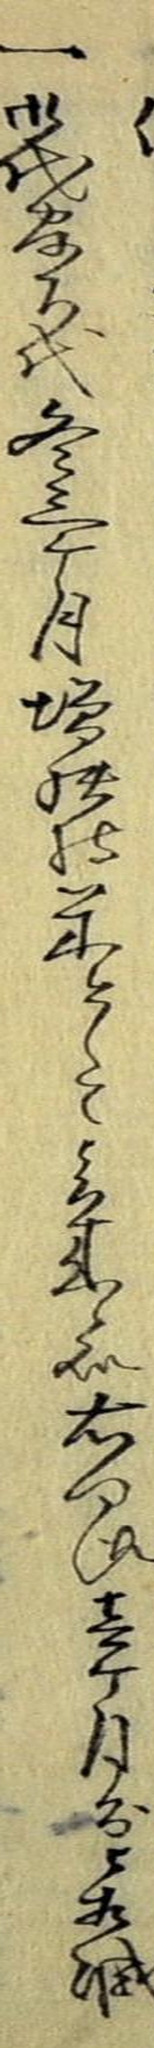一御代官下代冬三ケ月増扶持米として被下来候処右同趣壱ケ月分被相減
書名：命令之部 五
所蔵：福井県文書館 Fukui Prefectural Archives
